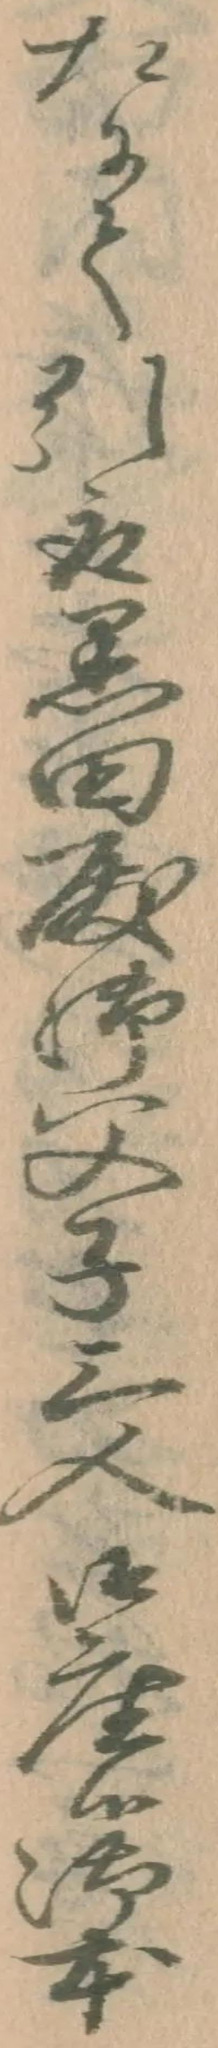た尓て引取黒田殿御父子三人御座候御本
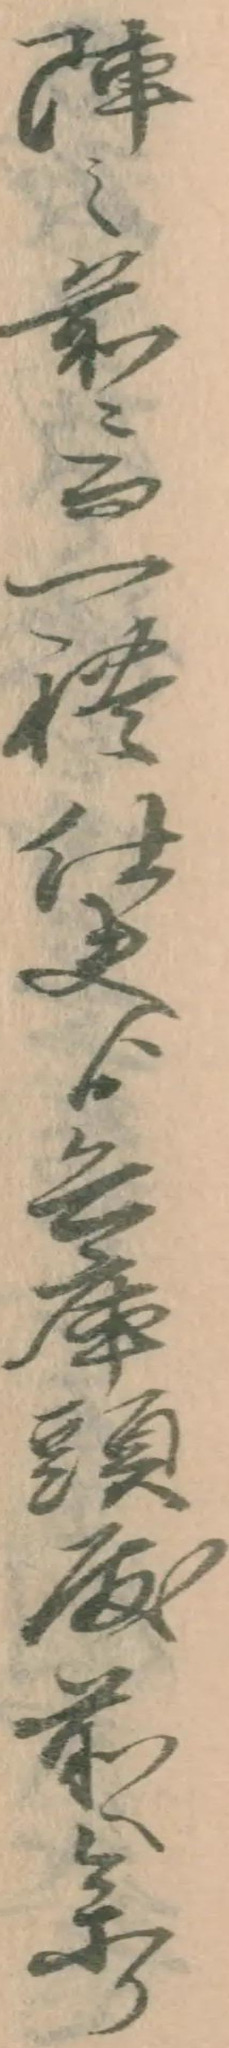陣之前に而一禮仕夫ゟ兵庫頭殿前へ参り
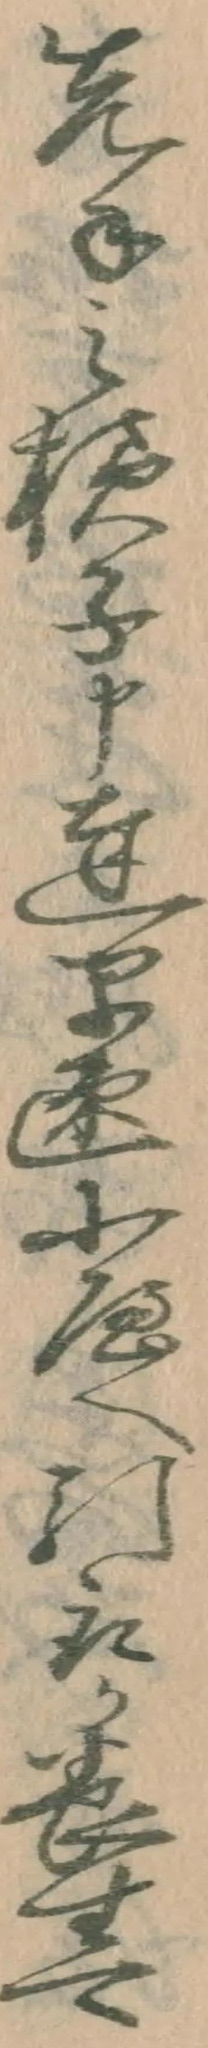先手之様子申達早速小屋へ引取り養生可
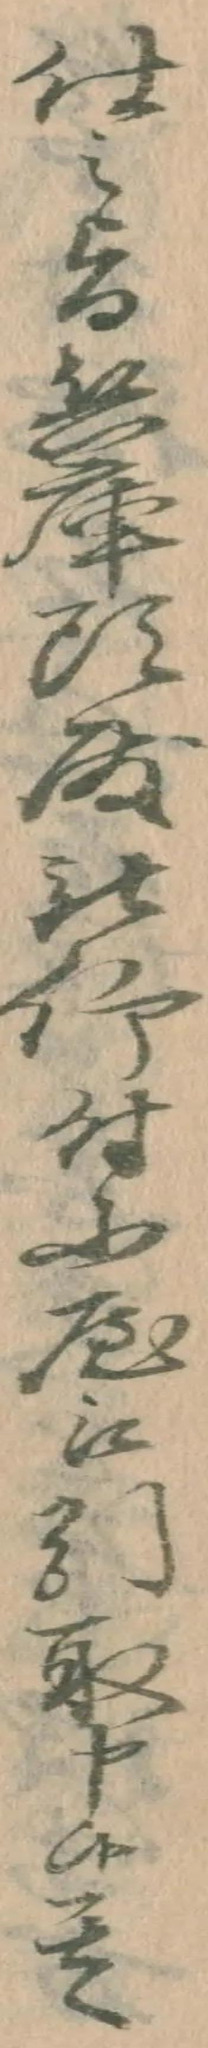仕之旨兵庫頭殿被仰付小屋江引取申候其
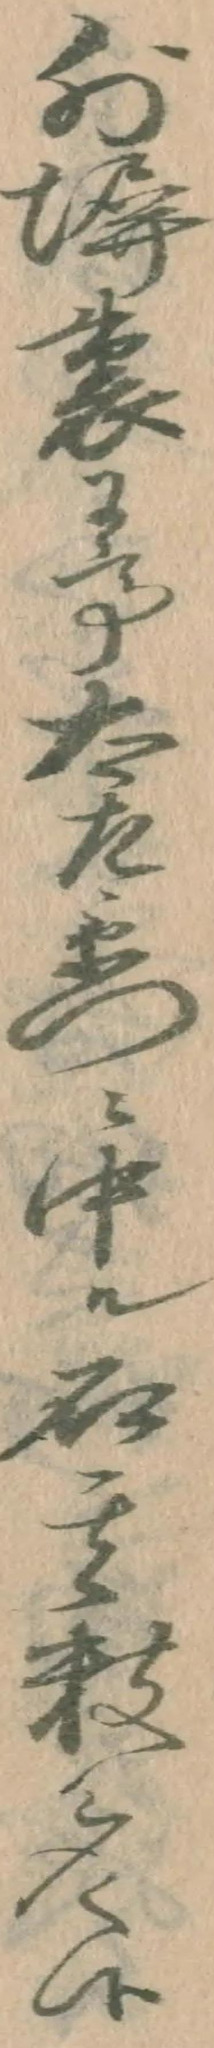外塀裏尓亭太左衛門に中る石其数多く候
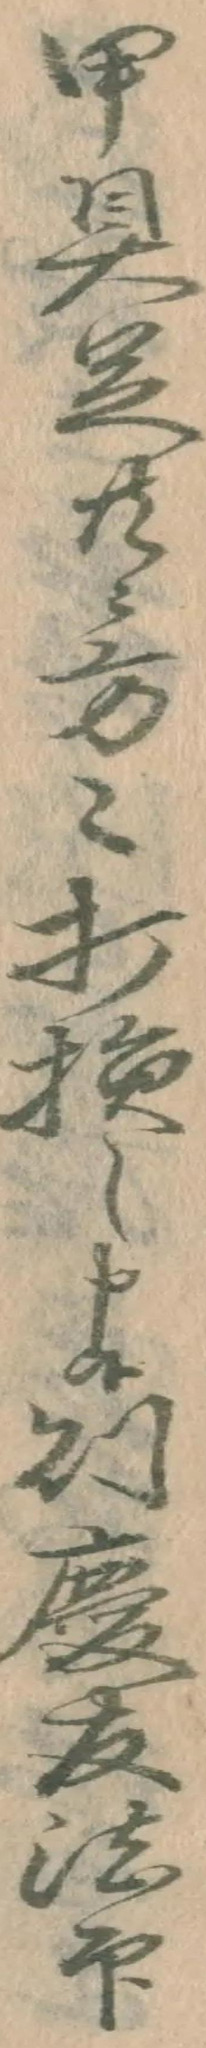甲具足共に方々打損し申候則慶友法印
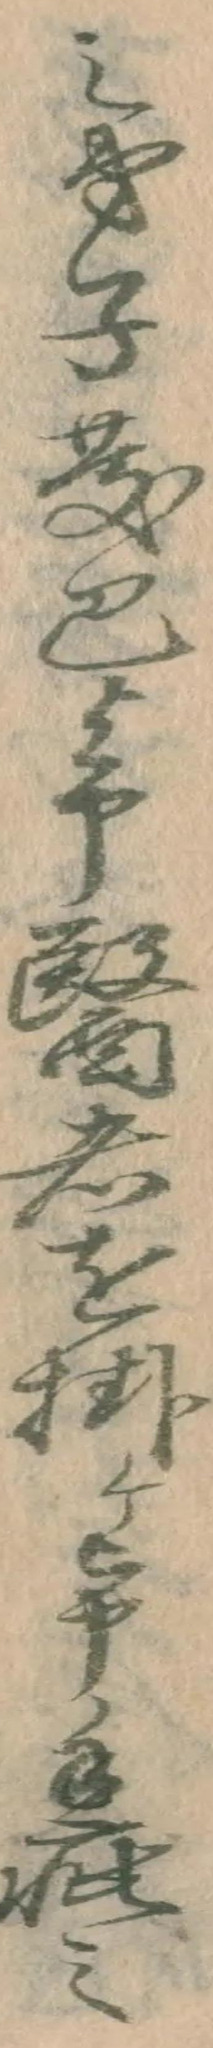之弟子発巳与申医者を掛け被申手疵之
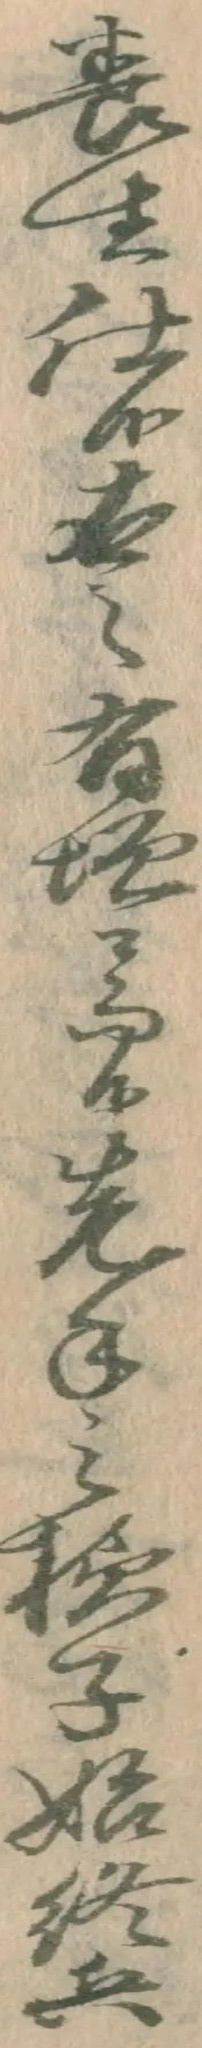養生仕候右之有増に而候先手之様子始終兵
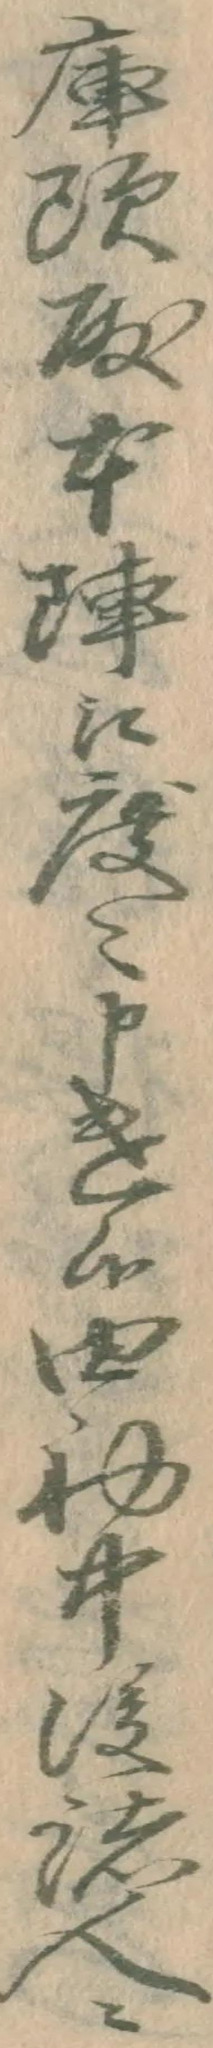庫頭殿本陣江度々申遣候由初中後諸人に
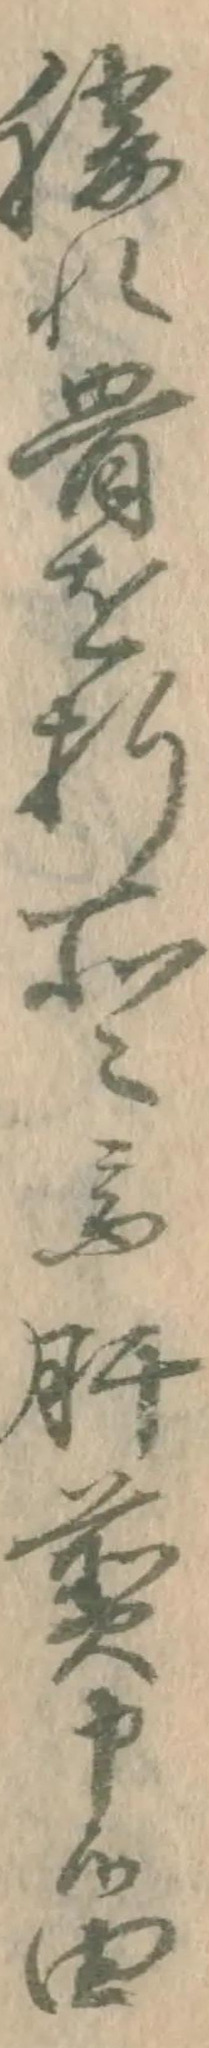勝れ骨を折所々に而肝煎申候由
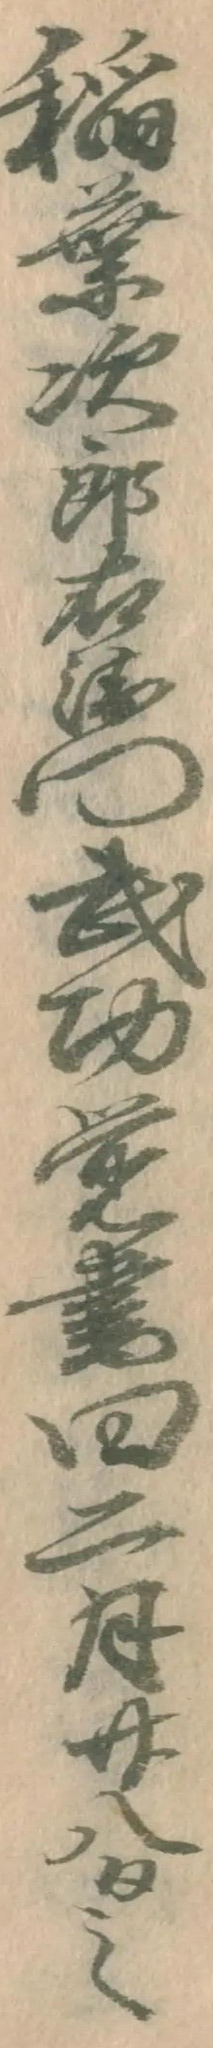稲葉次郎右衛門武功覚書曰二月廿八日之

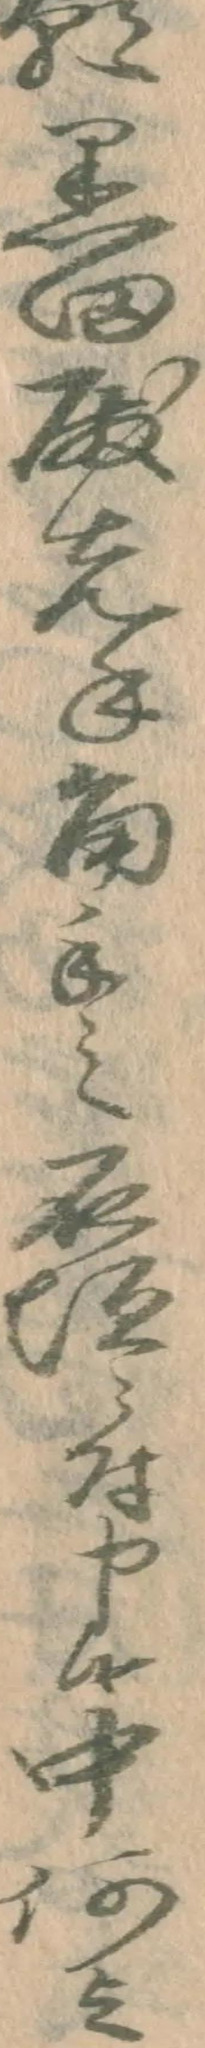朝黒田殿先手角手之石垣に付申候中何与
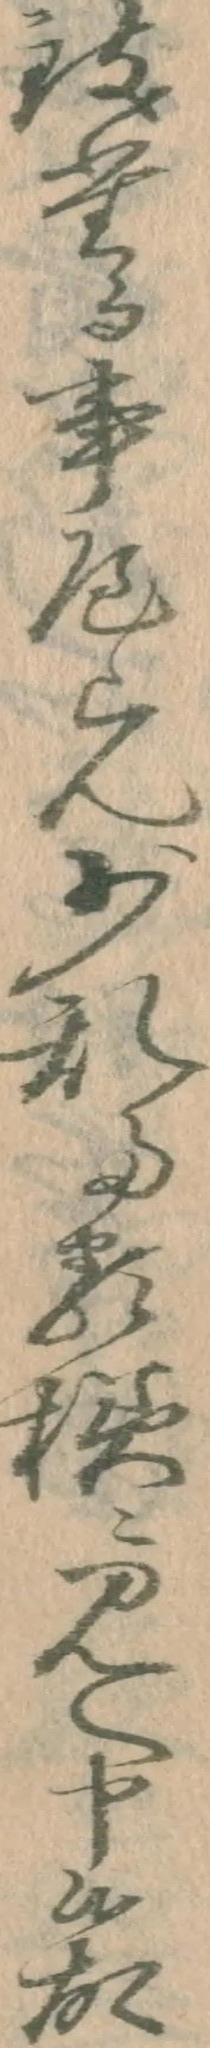致堂る事屋らん少乱多類様に見へ申候故
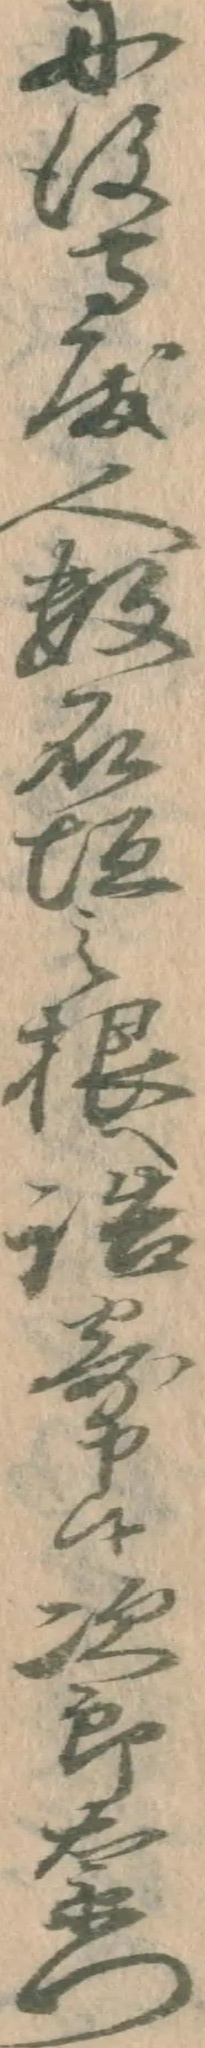丹後守殿人数石垣之根へ詰寄申候次郎右衛門
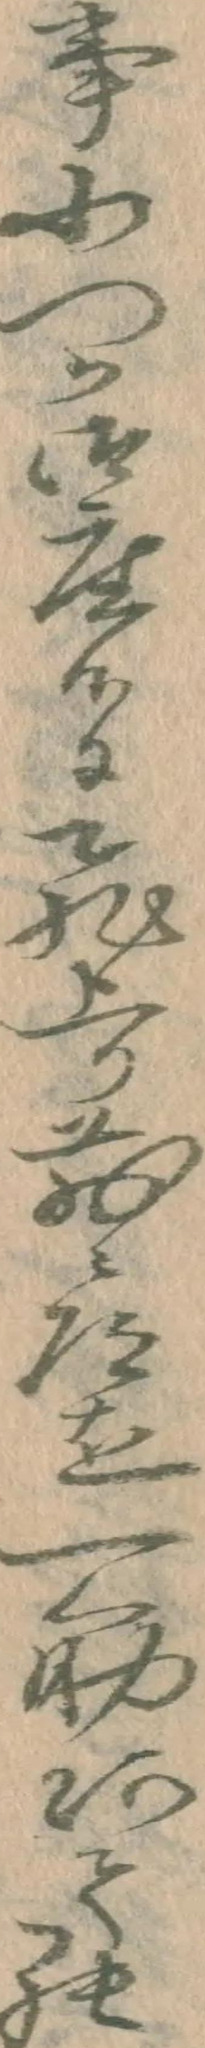事小つか御座候尓飛上り前に道を一筋阿て罷
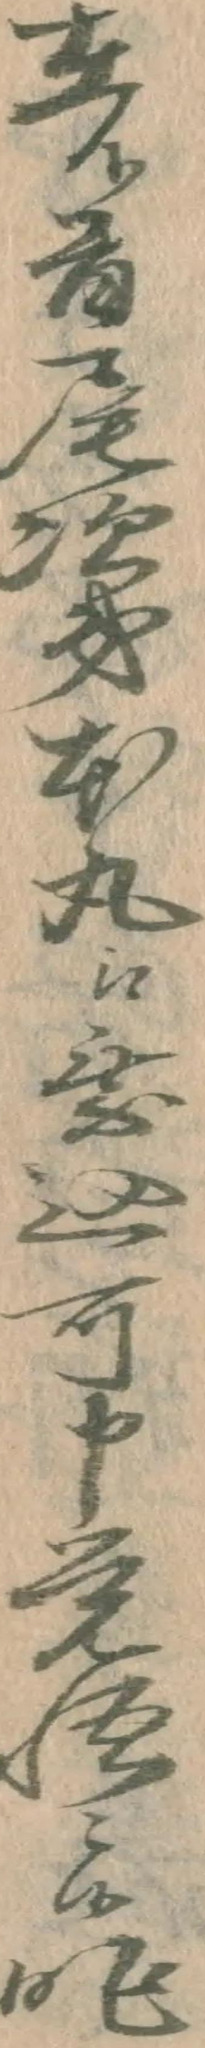在候首尾次第本丸江乗込可申覚悟に候昨
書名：切支丹御退治記 49巻. [8]
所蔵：国立国会図書館 National Diet Library, JAPAN
